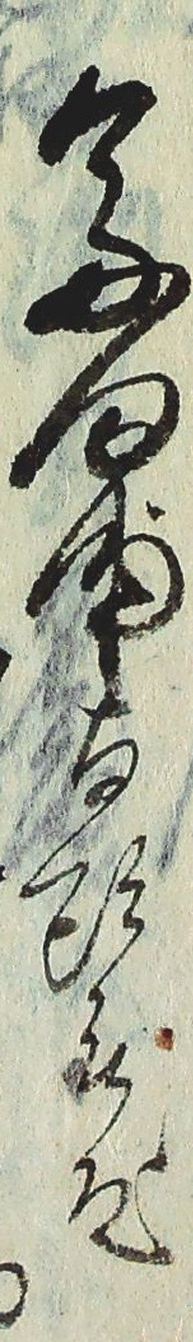冨田浦与頭庄屋
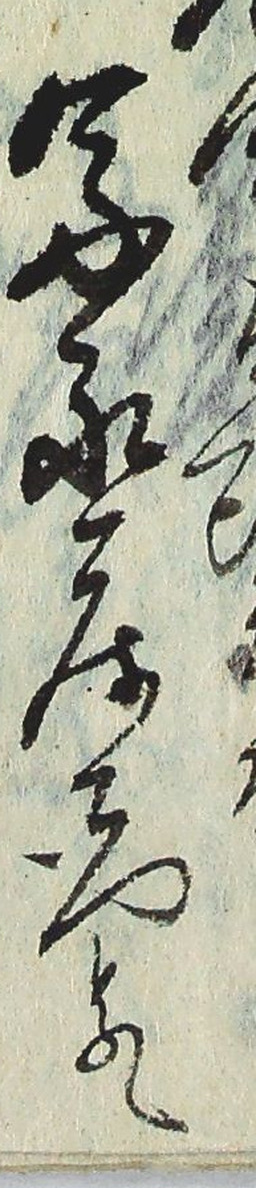富永茂右衛門とのへ
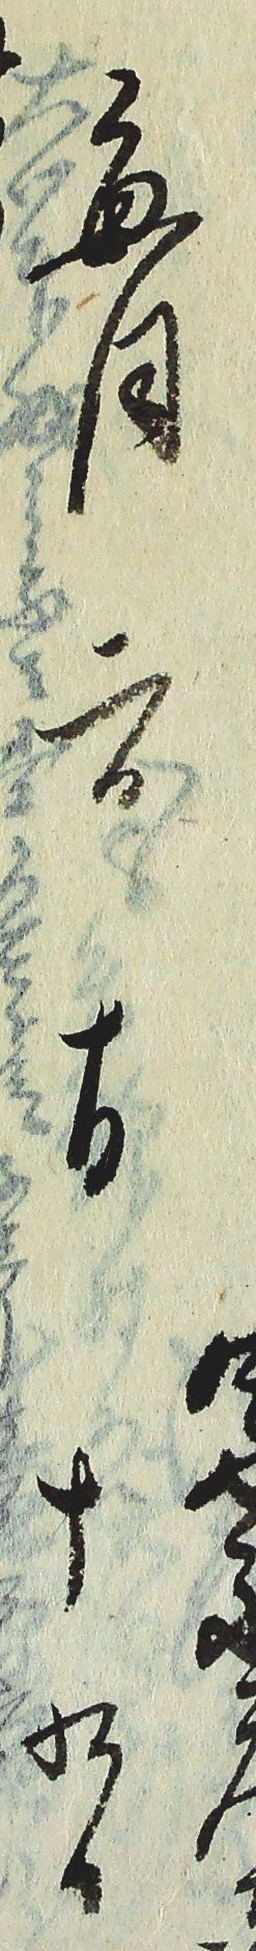毎月二日十日十九日
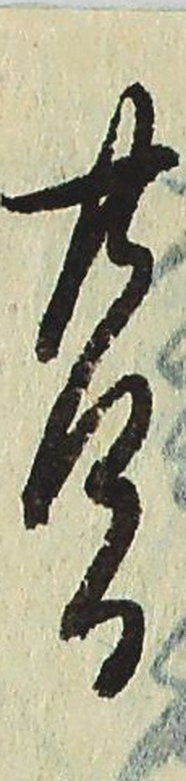廿四日
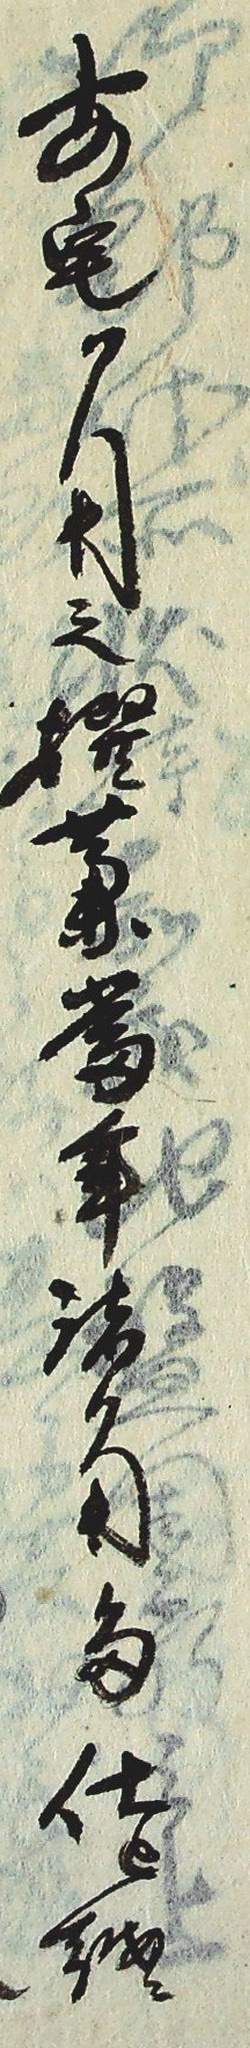安宅御用之撰藁当年諸御用多仕被越に
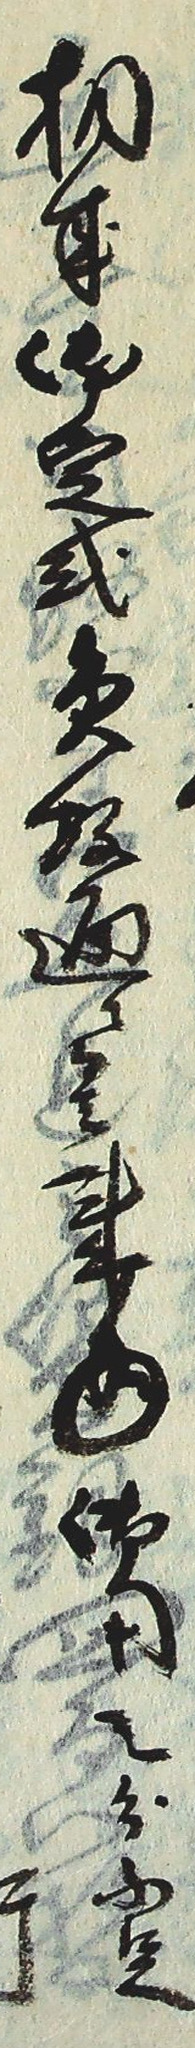相成御定式員数通にては来年御用之分不足
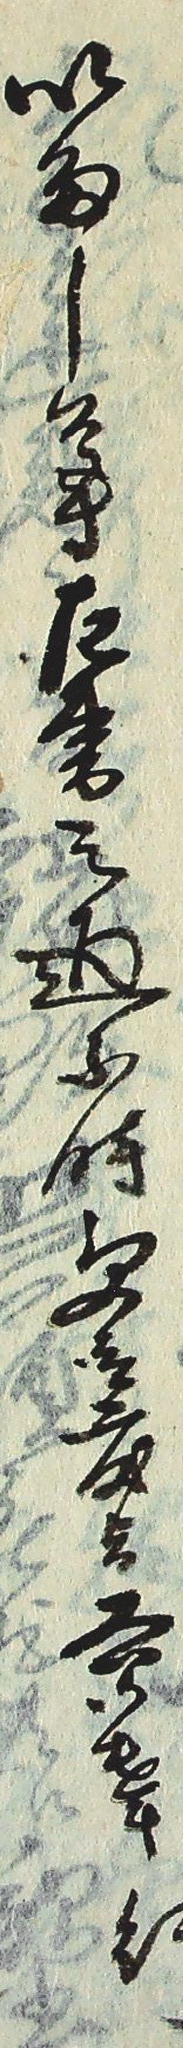いたし候に付左書之通不時受取度旨各御奉行
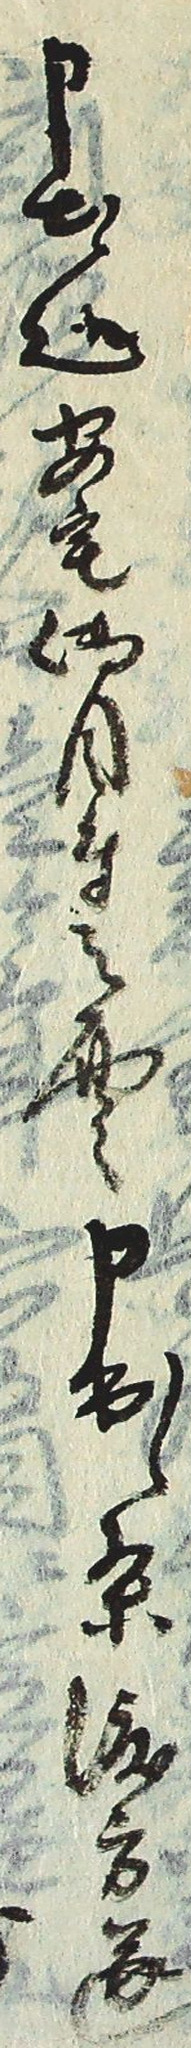申出候趣安宅御目付之面々申出候条渡方遂
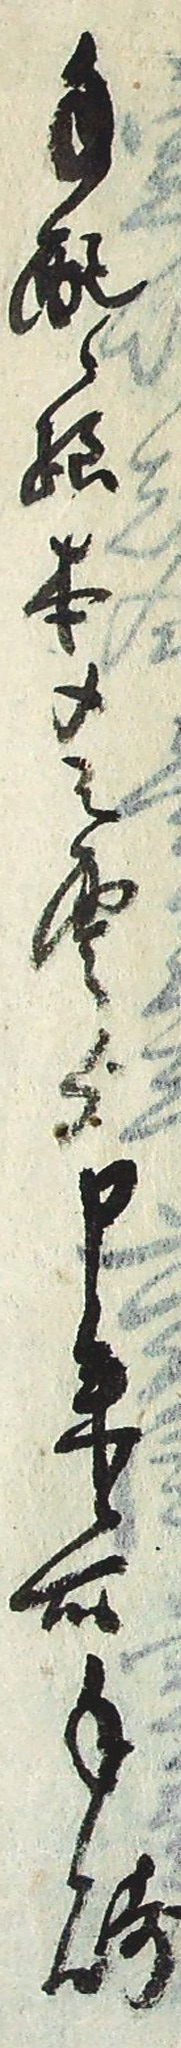手配候様本〆之面々ゟ申来候所手崎

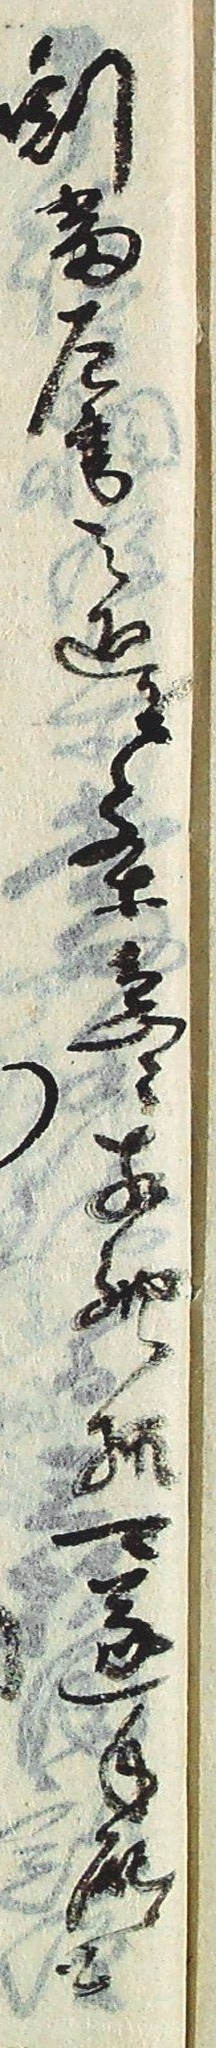割当左書之通りに候条急々相納候様可遂手配候以上
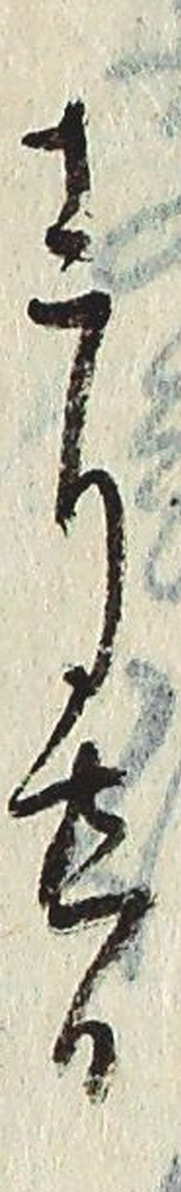十二月廿一日
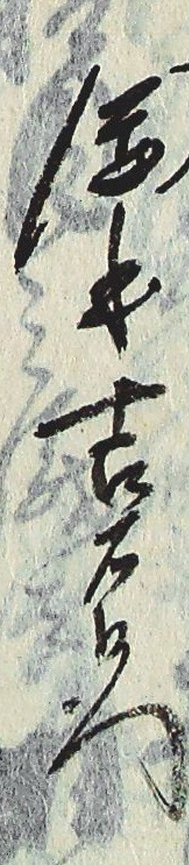岡本吉右衛門
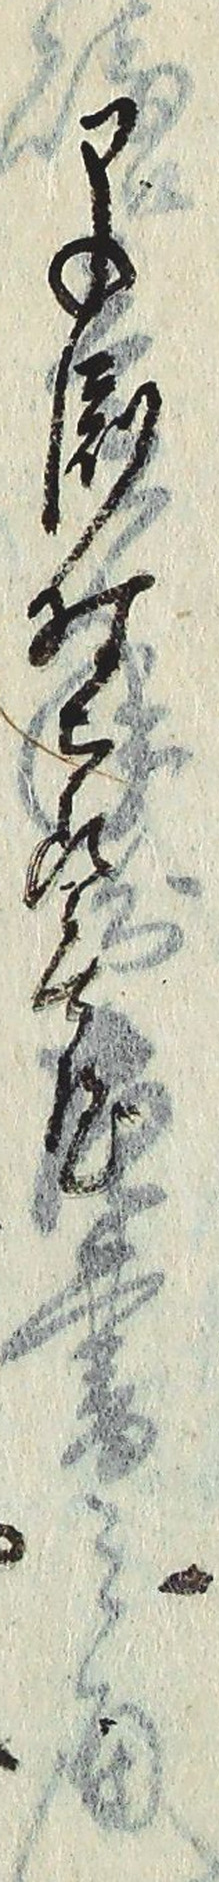早淵村与頭庄屋
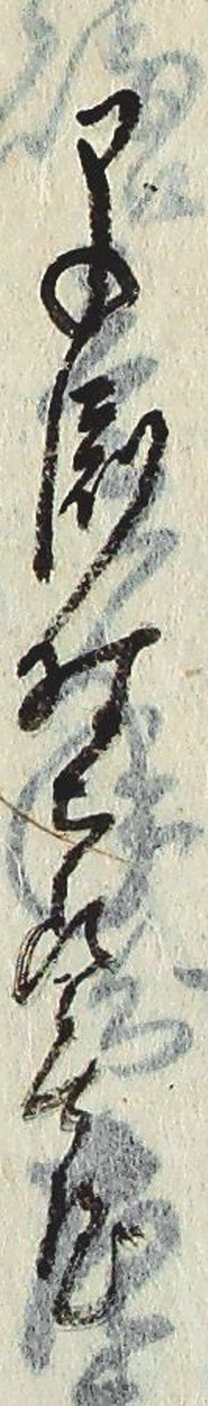早淵村与頭庄屋
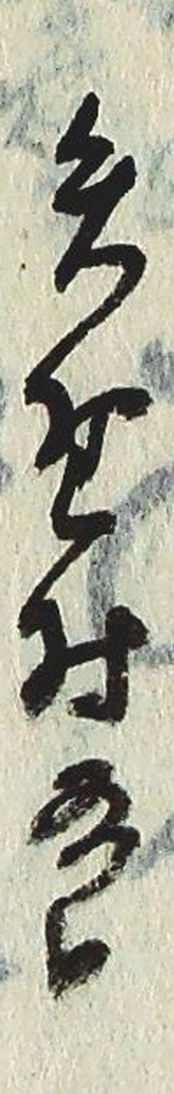矢野村右同
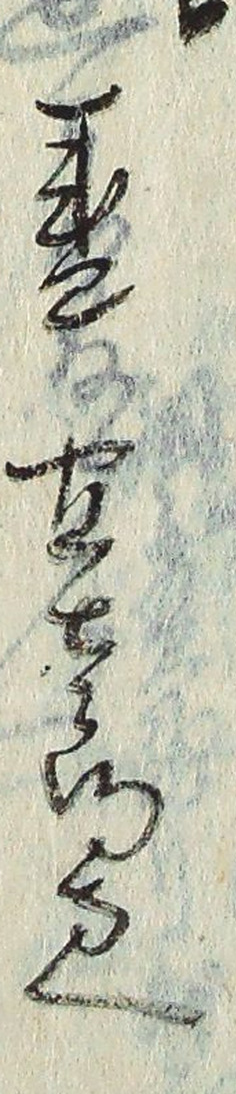盛宣七郎方へ
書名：名東郡中諸割賦元帳
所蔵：鳴門教育大学 Naruto University of Education
